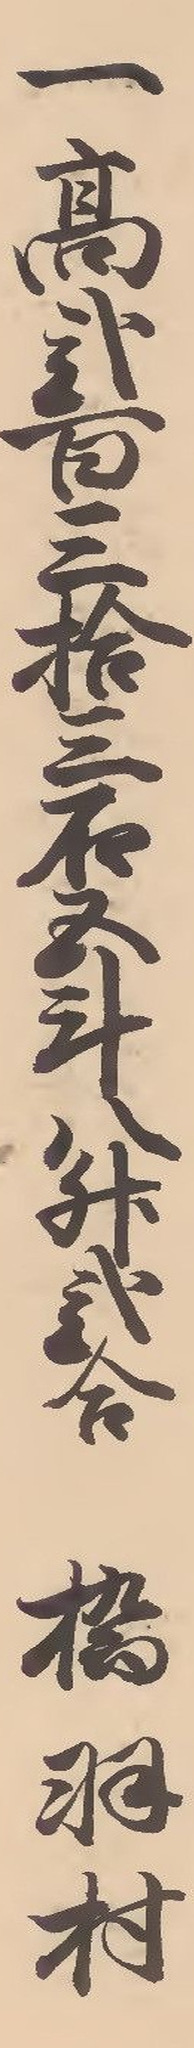一高弐百三拾三石五斗八升弐合橋羽村

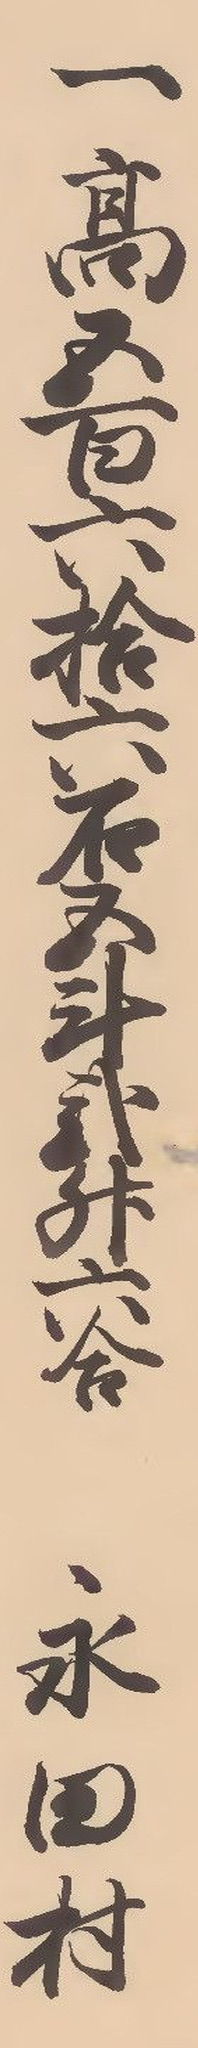一高五百六拾六石五斗弐升六合永田村
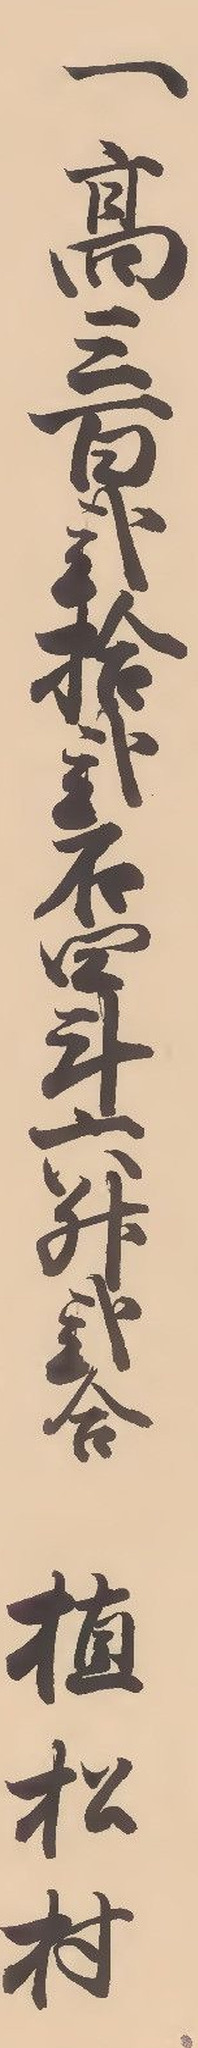一高三百弐拾弐石四斗六升弐合植松村
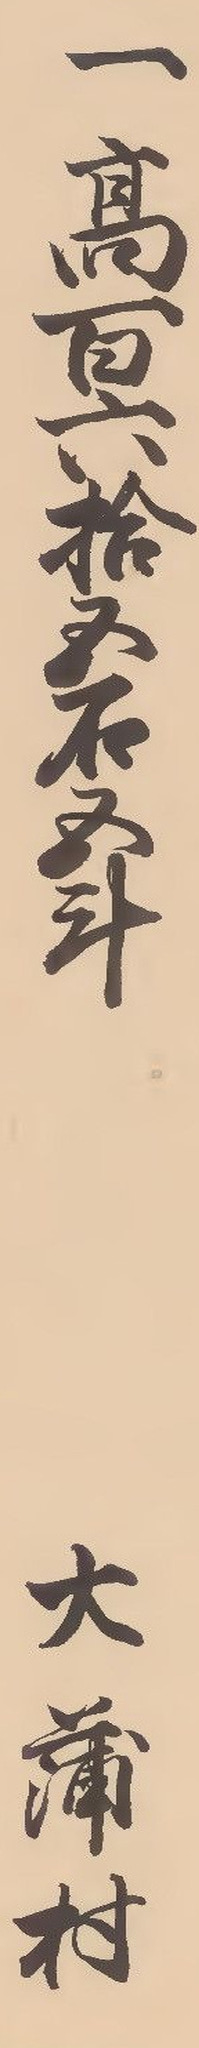一高百六拾五石五斗大蒲村
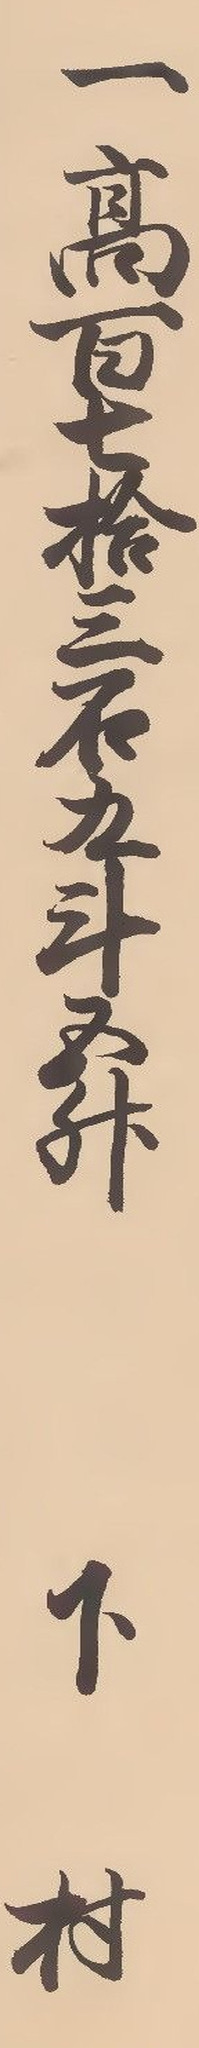一高百七拾三石九斗五升下村
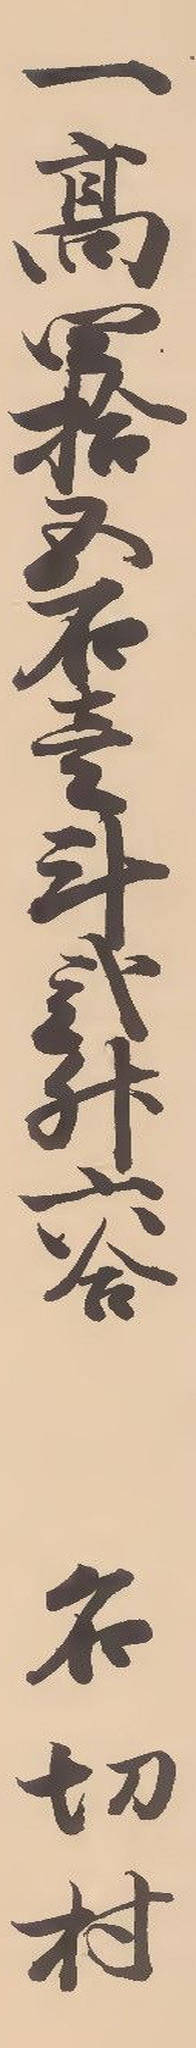一高四拾五石壱斗弐升六合名切村
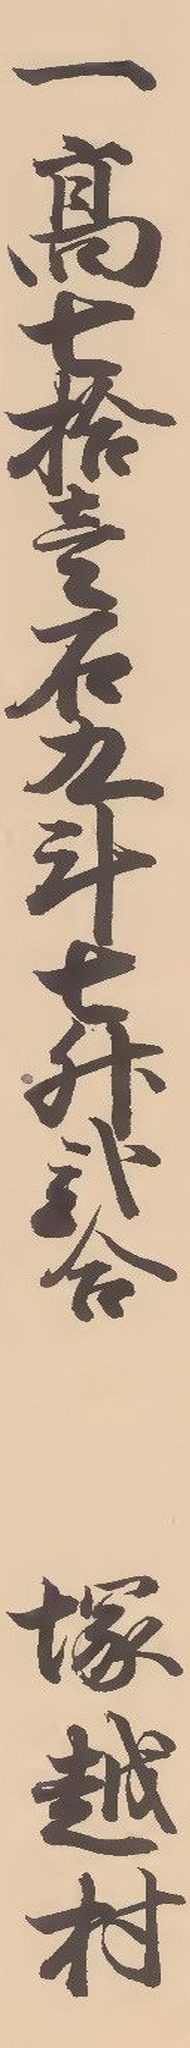一高七拾壱石九斗七升弐合塚越村
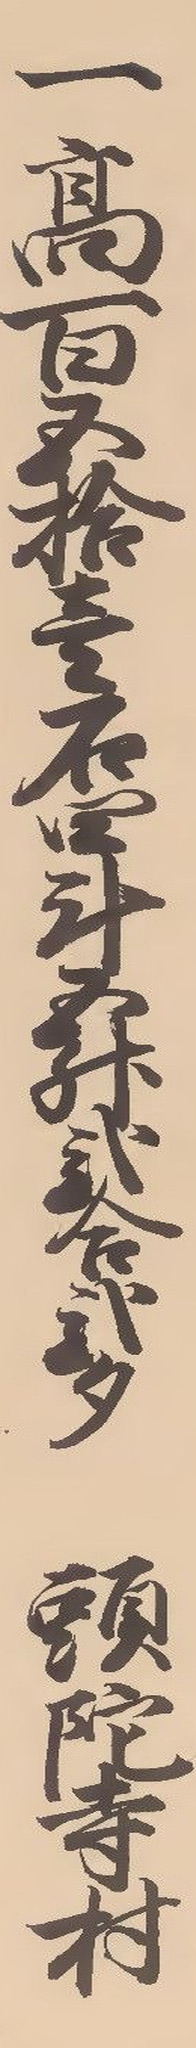一高百五拾壱石四斗五升弐合弐勺頭陀寺村
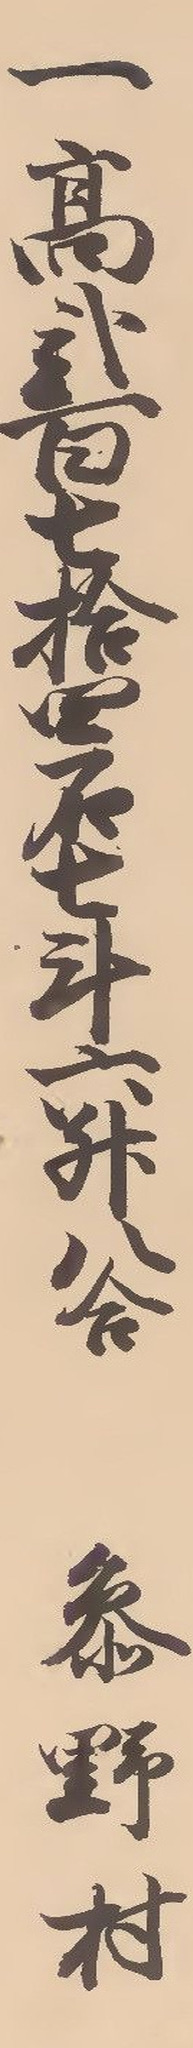一高弐百七拾四石七斗六升八合参野村

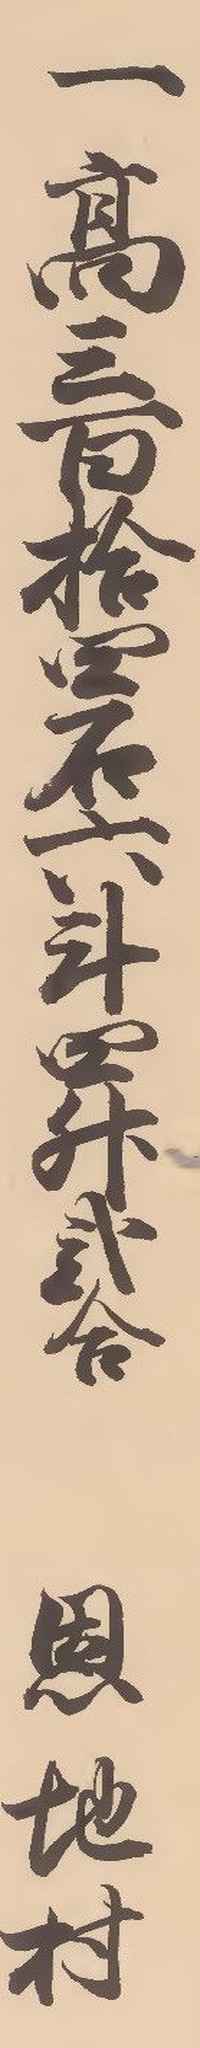一高三百拾四石六斗四升弐合恩地村
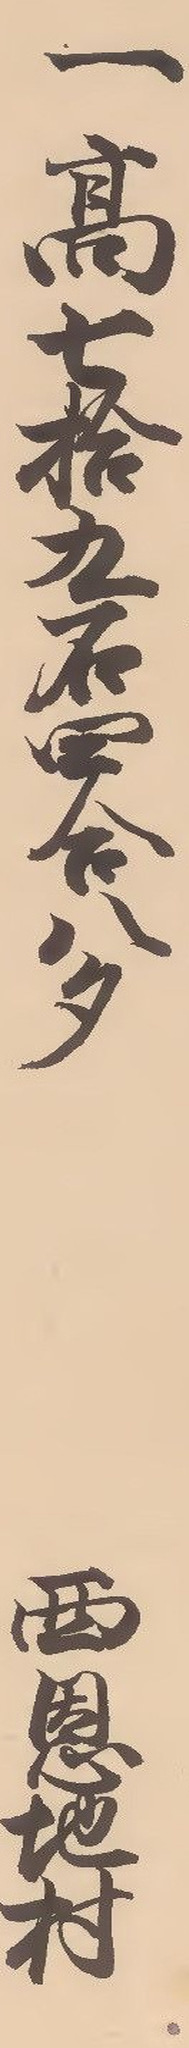一高七拾九石四合八勺西恩地村
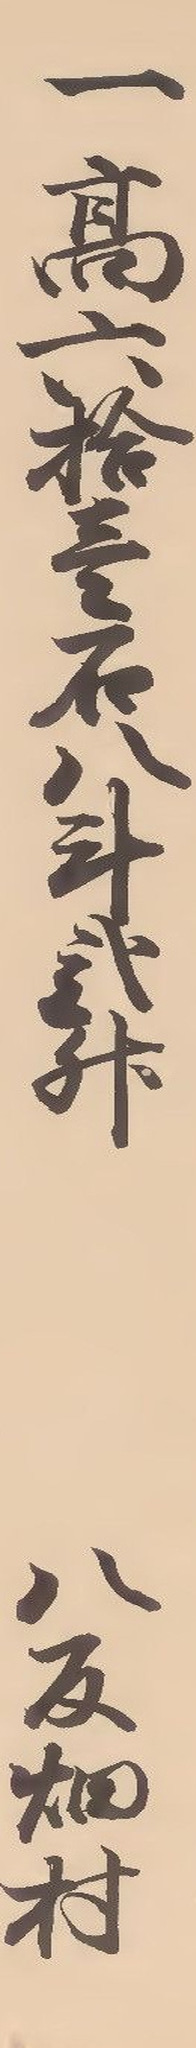一高六拾壱石八斗弐升八反畑村
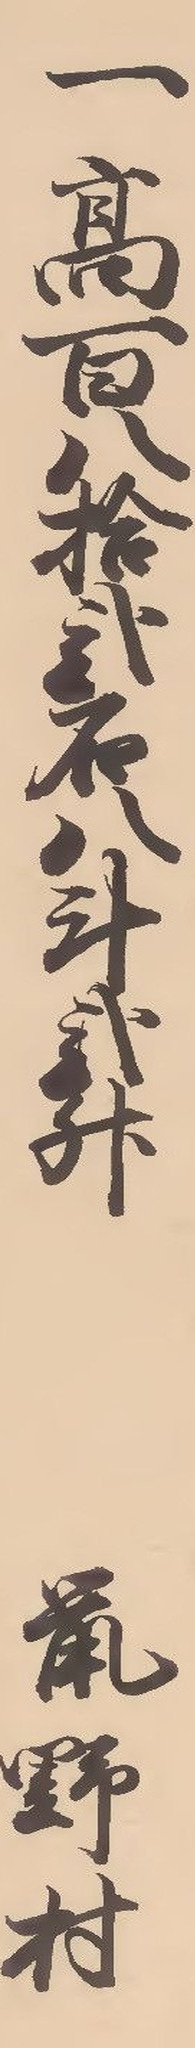一高百八拾弐石八斗弐升鼠野村
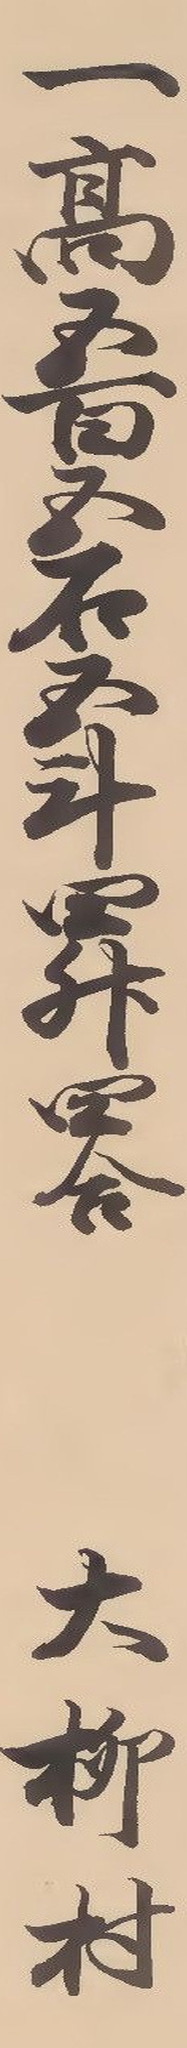一高五百五石五斗四升四合大柳村
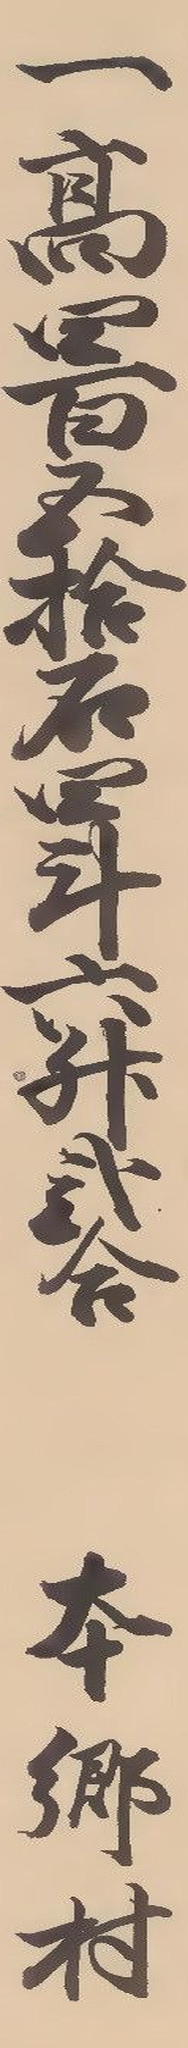一高四百五拾石四斗六升弐合本郷村
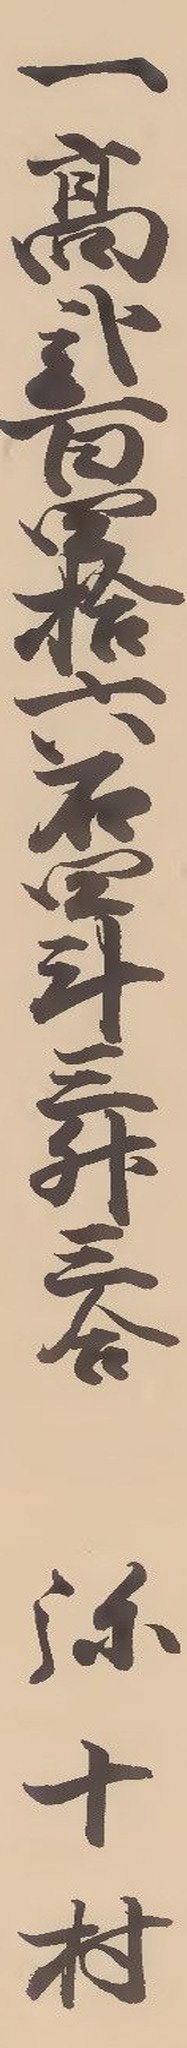一高弐百四拾六石四斗三升三合弥十村
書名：遠江国郷帳
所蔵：国立公文書館 National Archives of Japan
